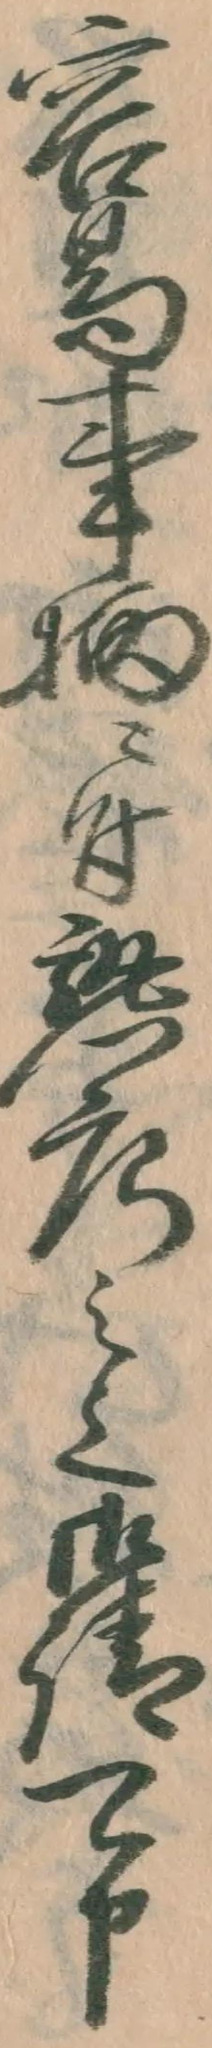容易事柄ニ付熟考之上御請可申
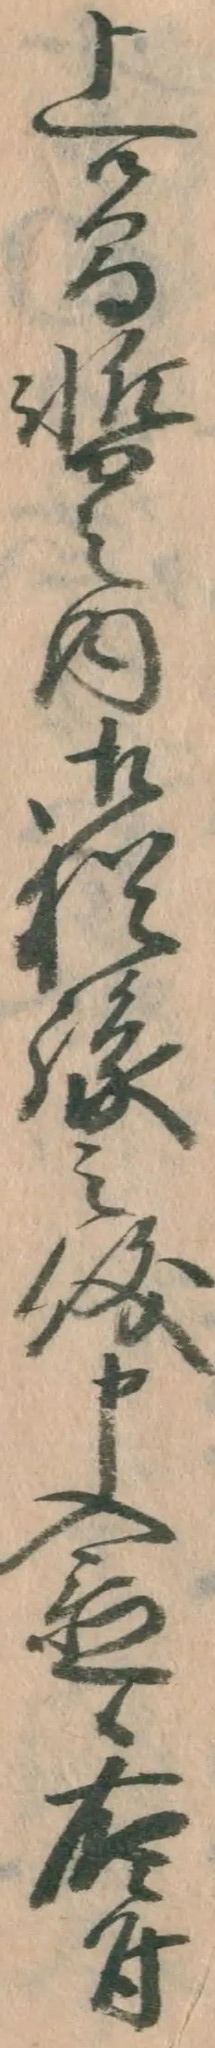上候間暫之内御猶豫之儀申入置候右ニ付
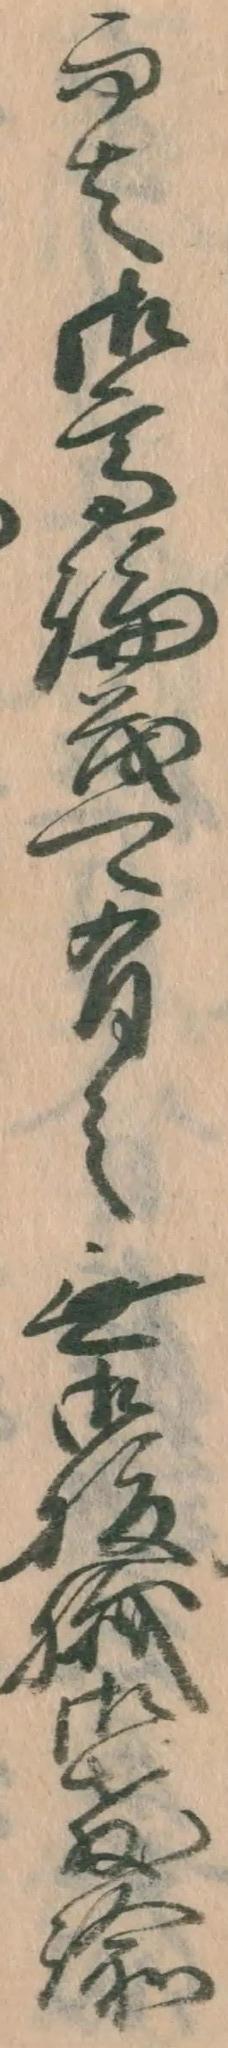而者御高論も可有之無御腹臓御教諭
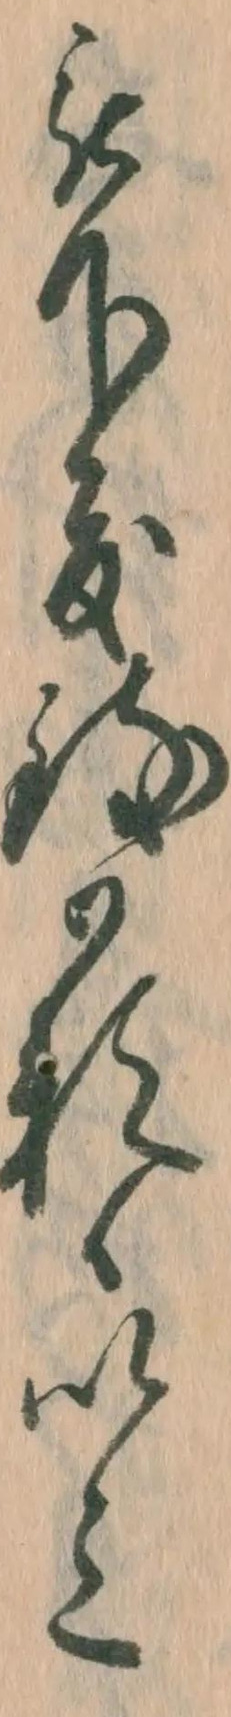被下度致御願候以上
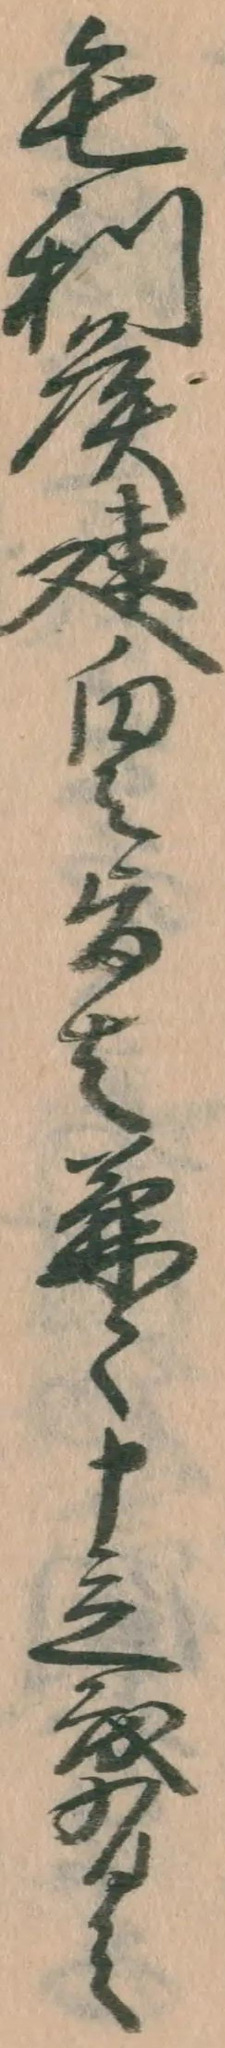毛利侯建白之旨者兼々申立も有之
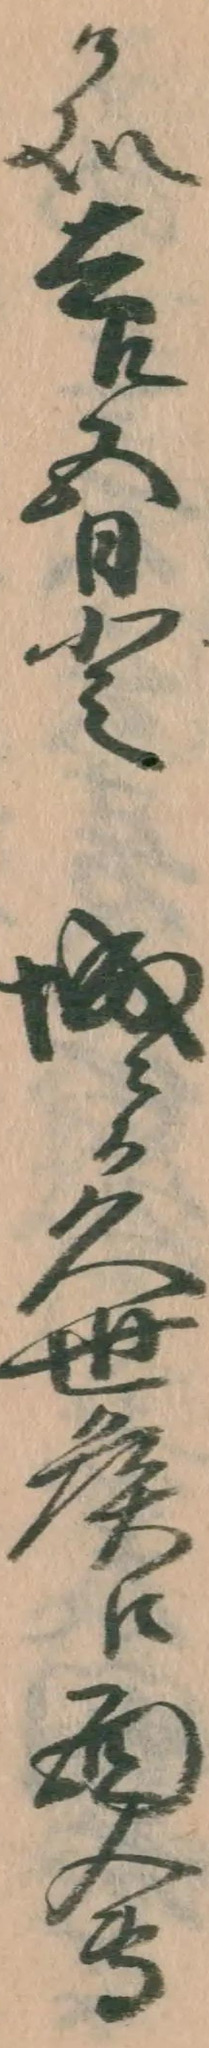候処去ル五日登城ニ而久世侯え面會
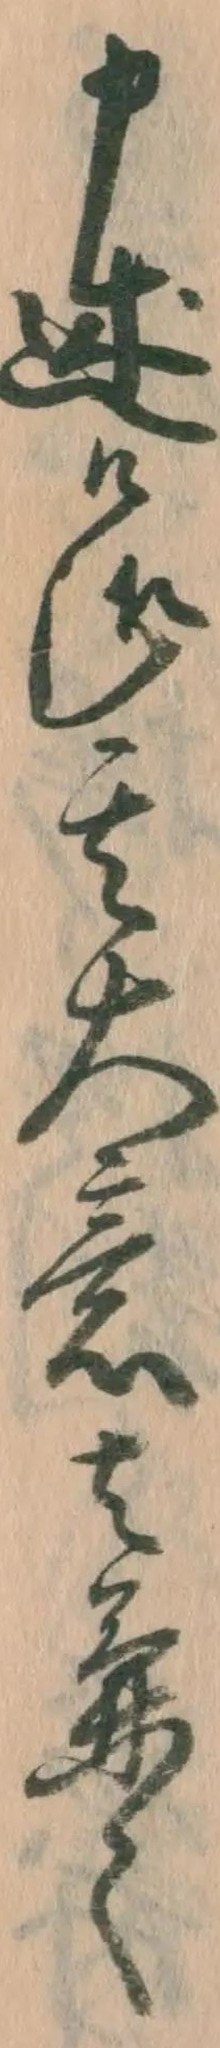申述候趣其大意者兼々
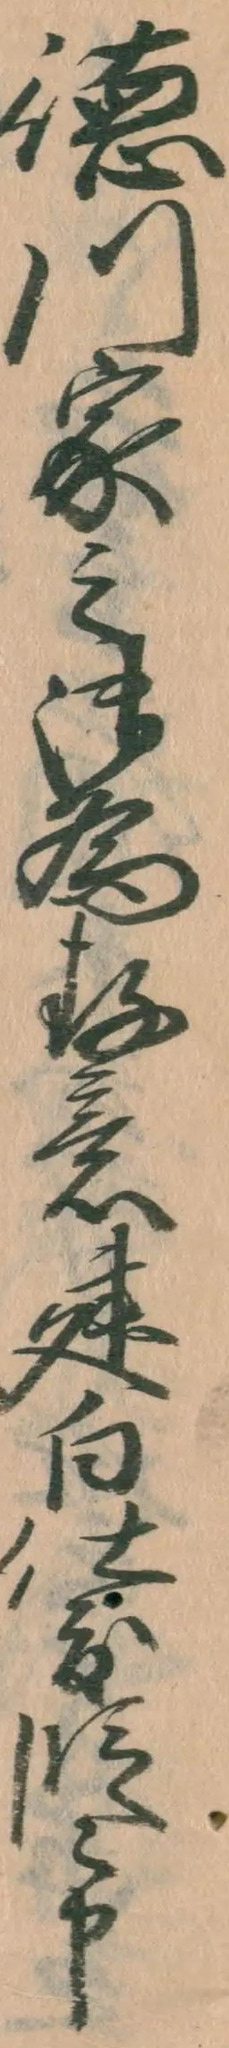徳川家之御為存意建白仕度段々申
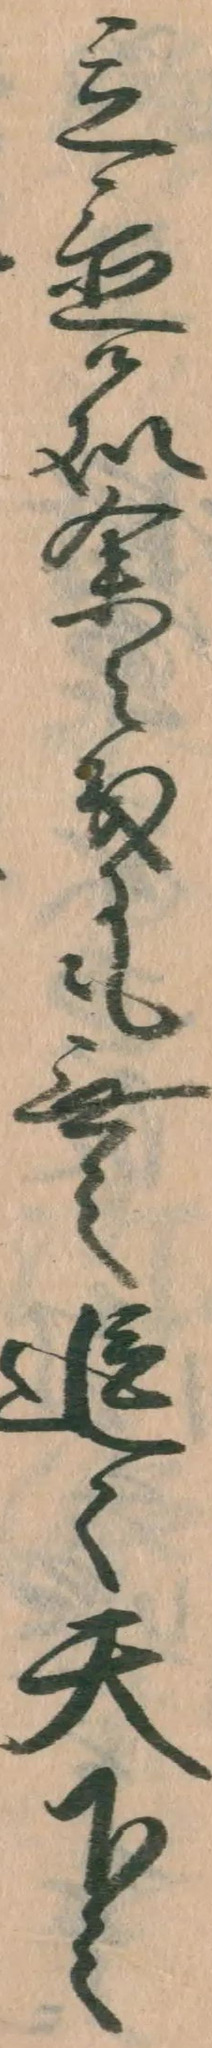立置候処余之義にも無之追々天下之
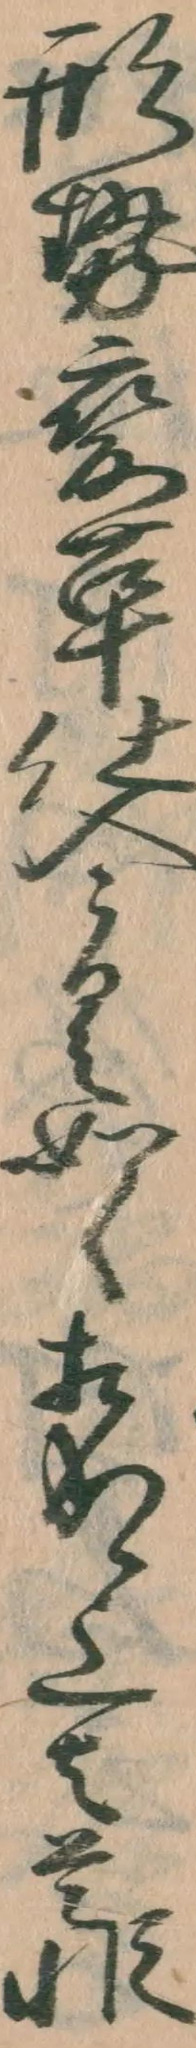形勢変革仕今日之如く相成候上者是非
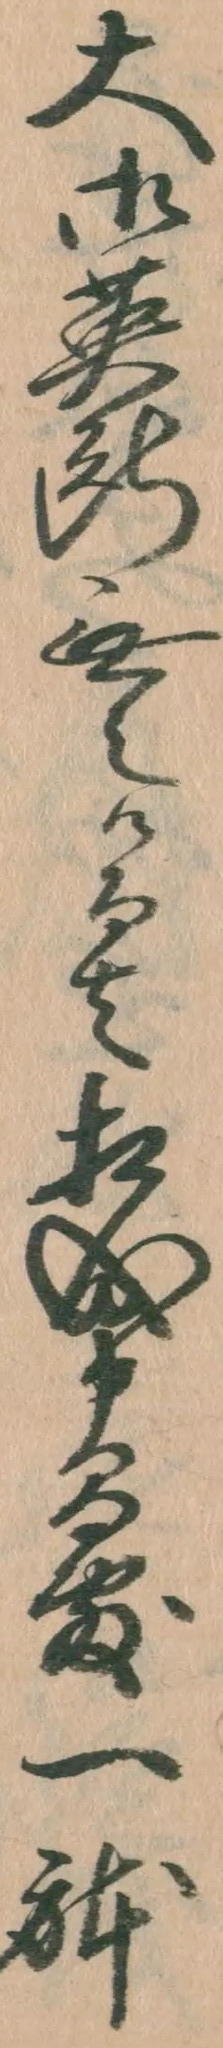大御英断無之候而者相成申間敷一躰
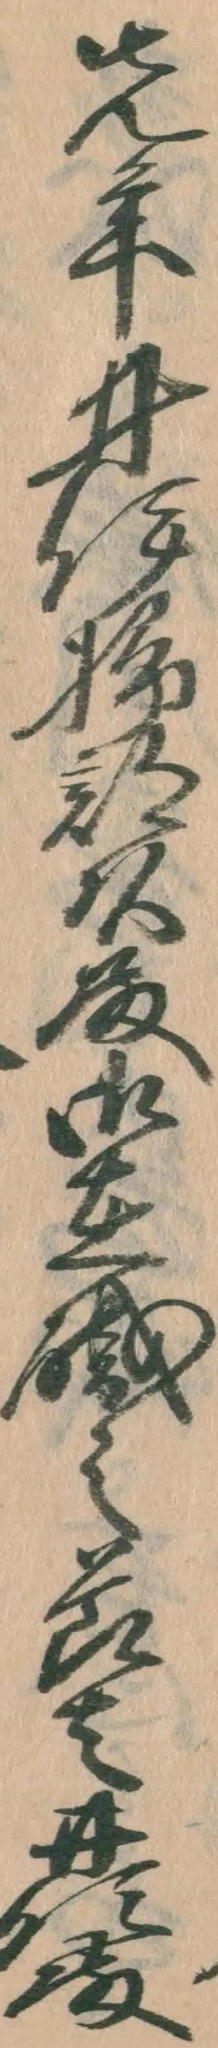先年井伊掃部頭殿御在職之節者井伊殿
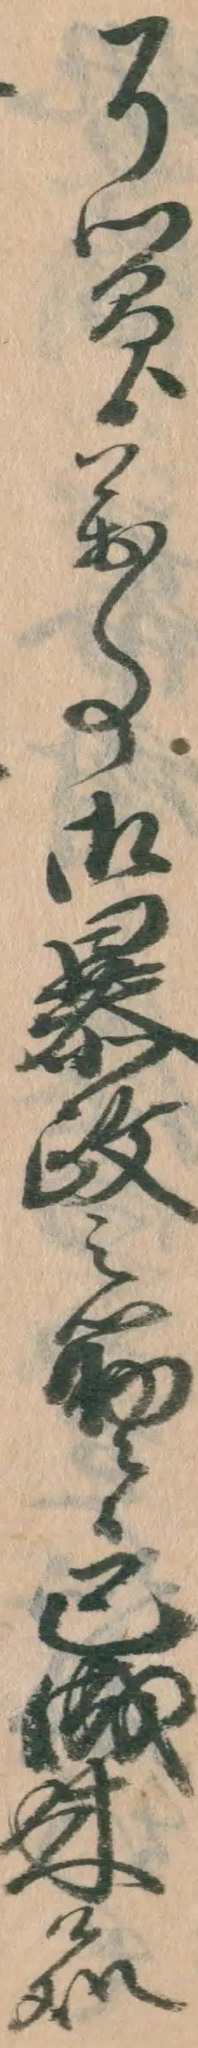了簡より萬事御暴政之筋ニ而已成来候処
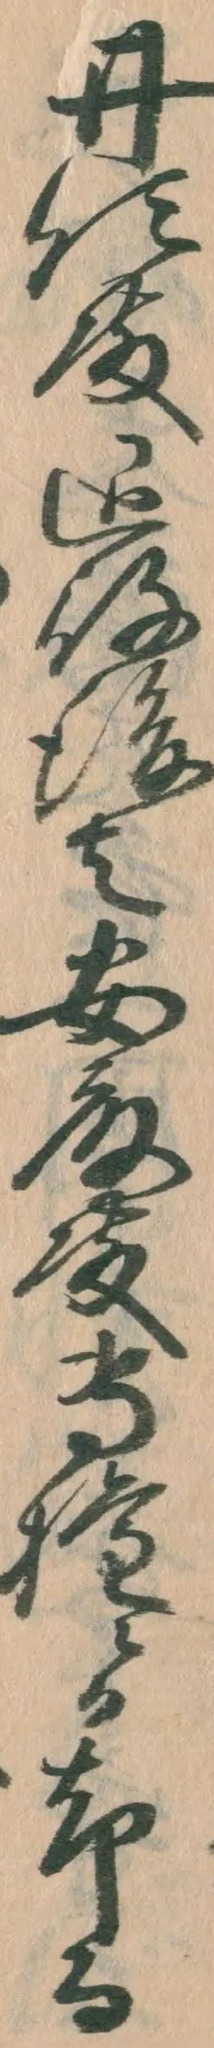井伊殿退役後者安藤殿専権ニ而却而
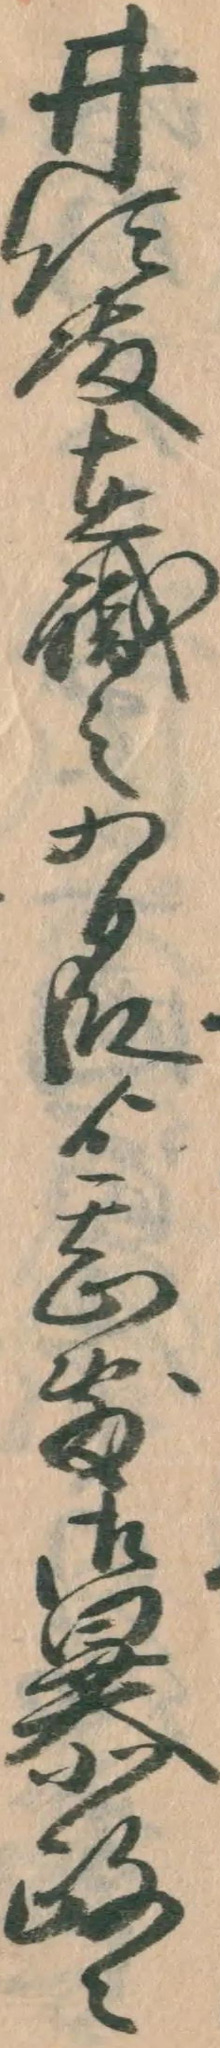井伊殿在職之有様より甚敷御暴政ニ
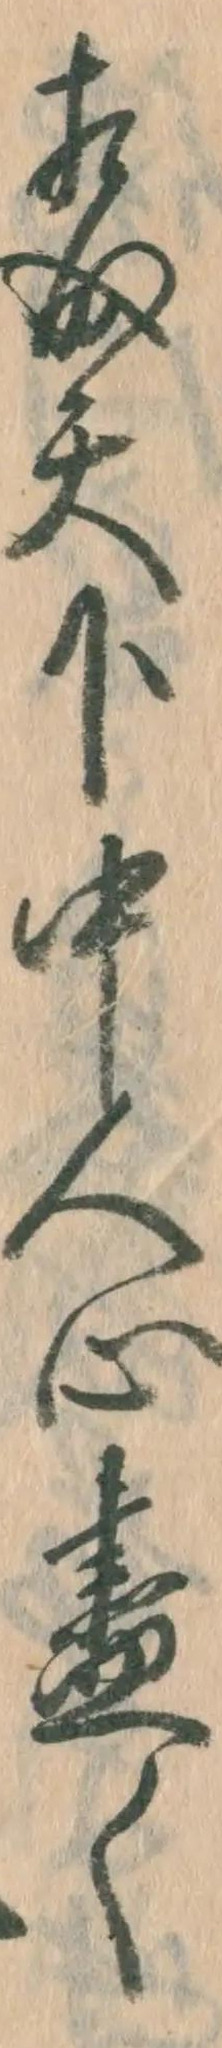相成天下中人心盡く
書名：麗斎叢書. 20
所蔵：国立国会図書館 National Diet Library, JAPAN
